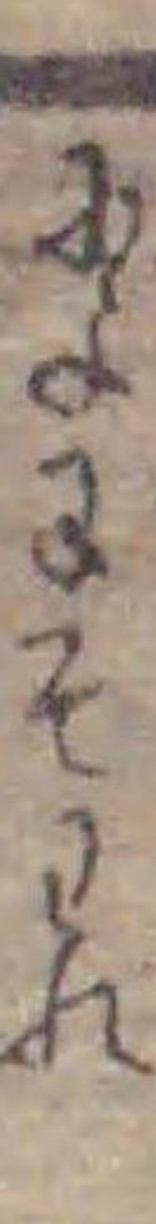によにそわれ

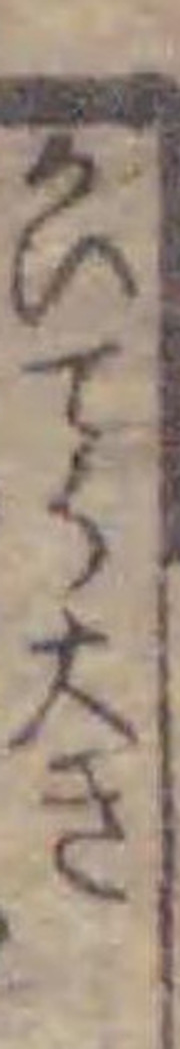かいてう大き
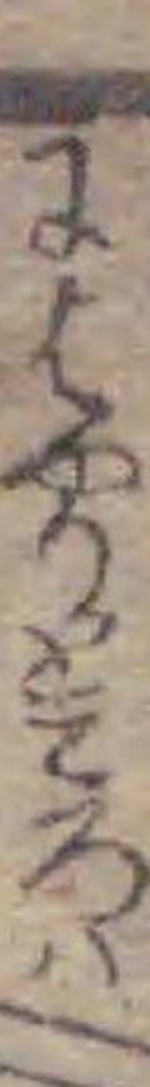にはやりところは
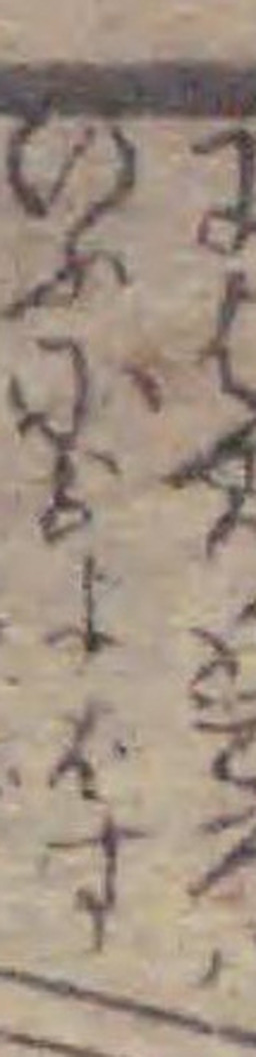いふにおよばす
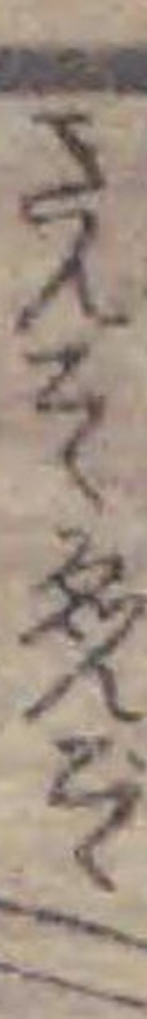きんこくゑんごく
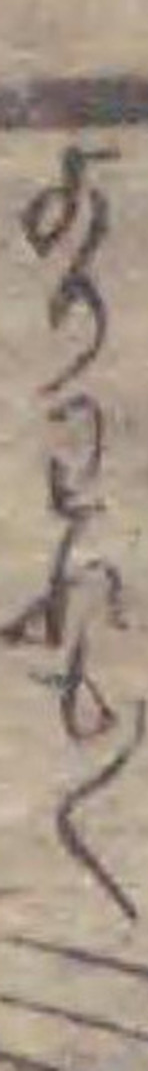よりわれも〳〵
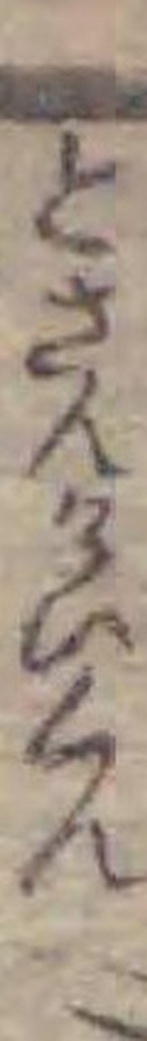とさんけいくん
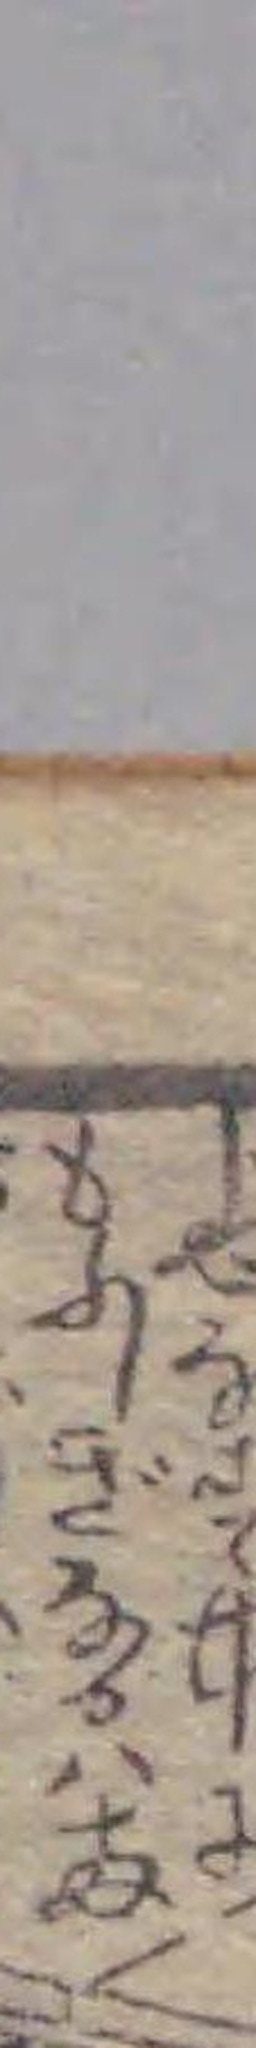もふしぎなるは両
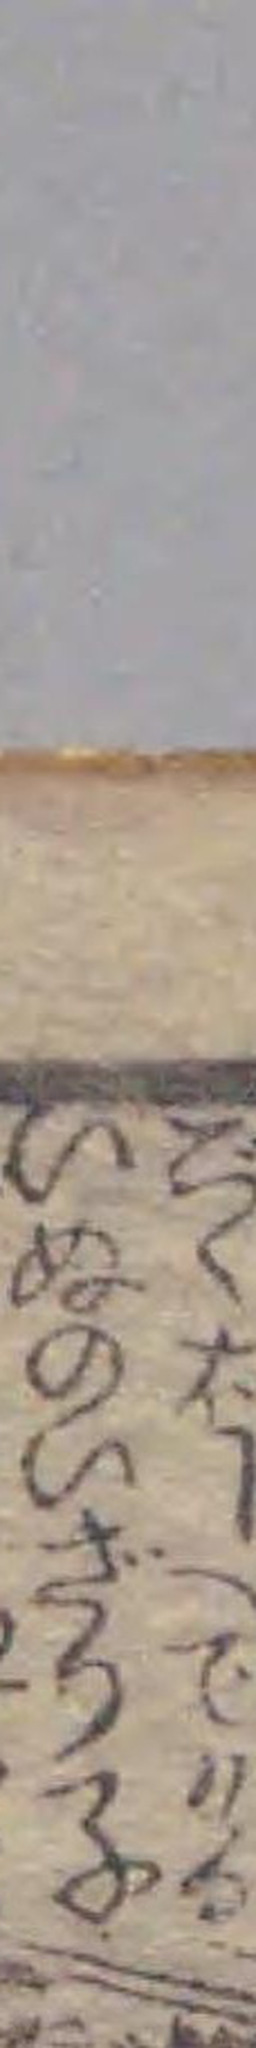いぬのいざり子
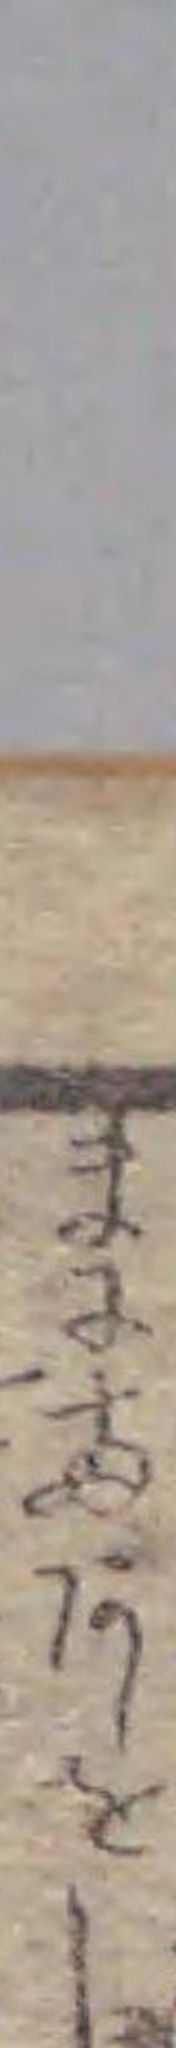まに両あしを
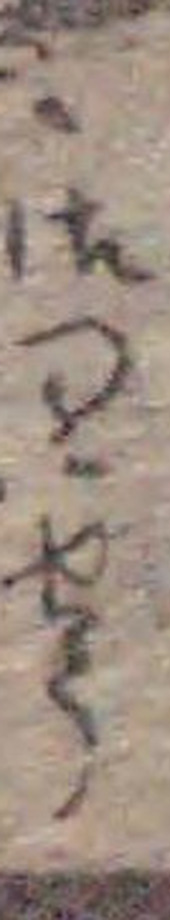御りせう
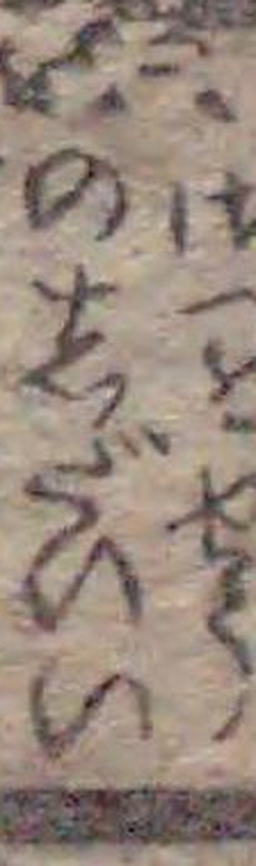のしだいい
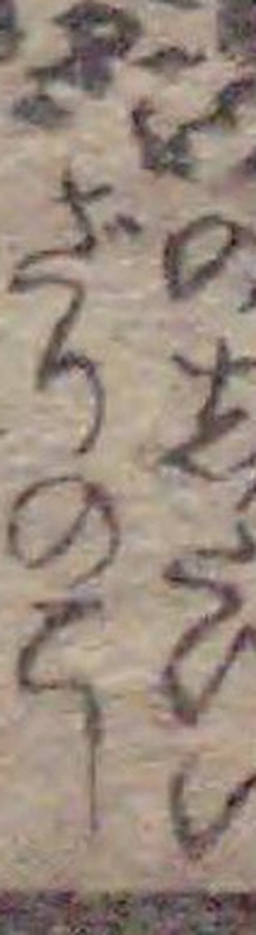ざりのこし
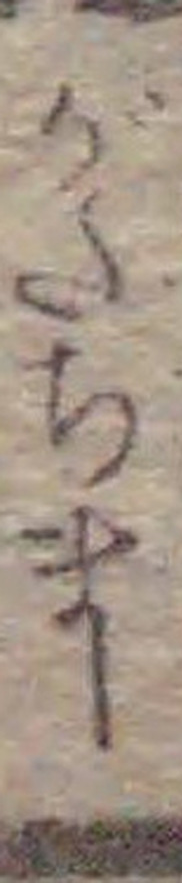がたちまし
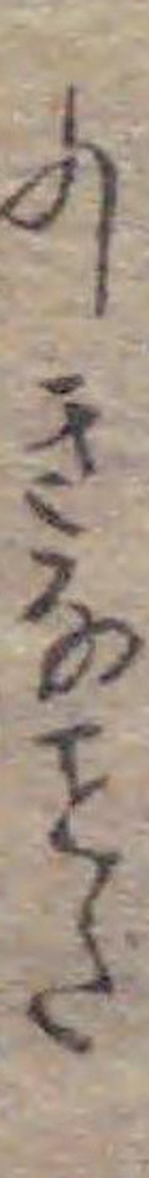ふしきなことだ
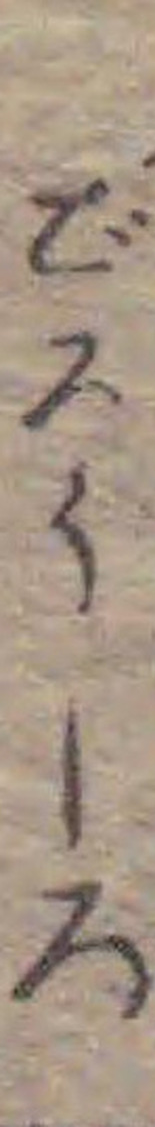ごろうしろ
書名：化物七段目 : 2巻
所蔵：国立国会図書館 National Diet Library, JAPAN
